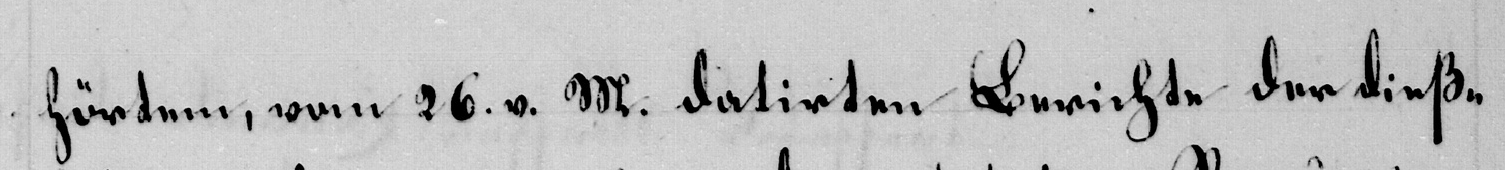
hörtem, vom 26. v. M. datirten Berichte der dieß¬
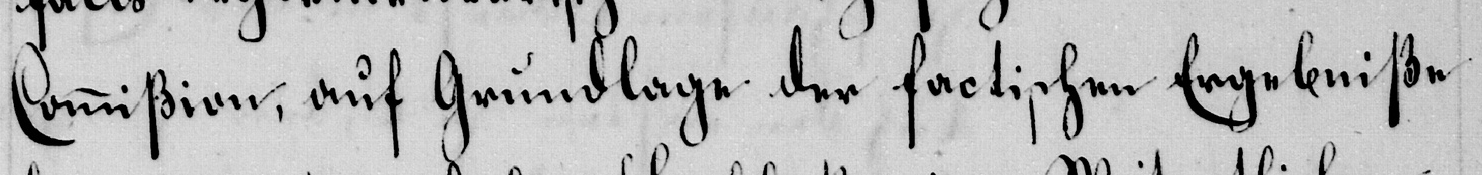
ommißion, auf Grundlage der factischen Ergebniße
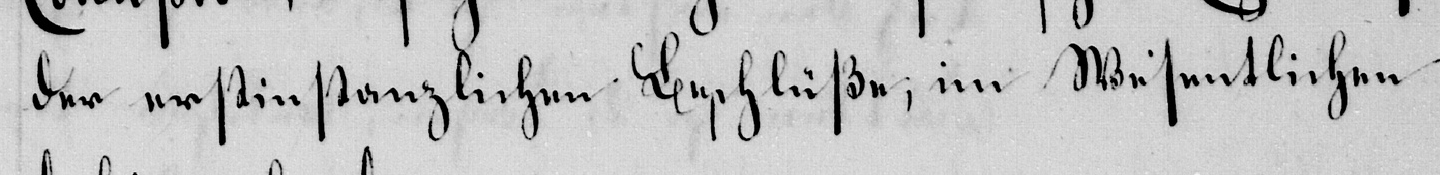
der erstinstanzlichen Beschlüße, im Wesentlichen
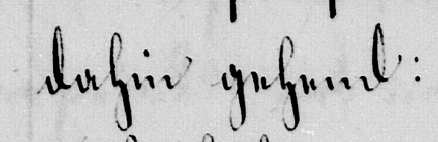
dahin gehend:
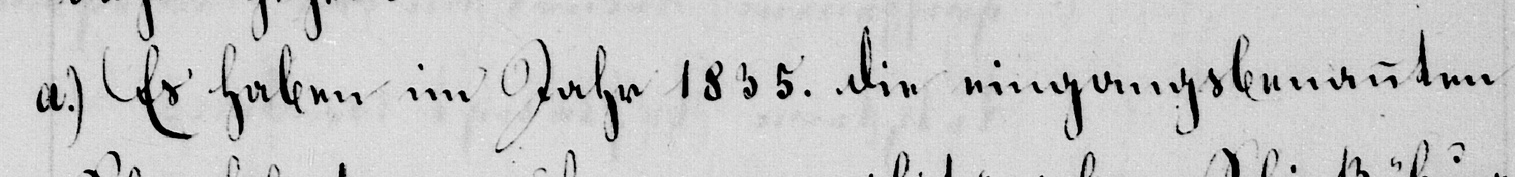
a.) Es haben im Jahr 1835. die eingangsbenannten
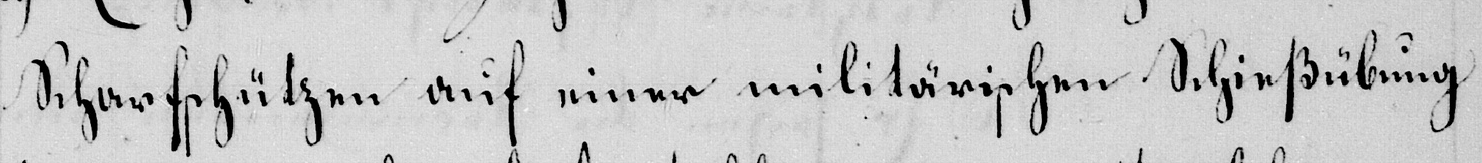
Scharfschützen auf einer militärischen Schießübung
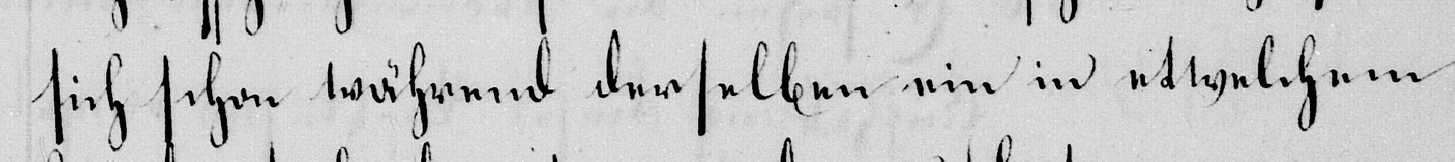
sich schon während derselben ein in etwelchem
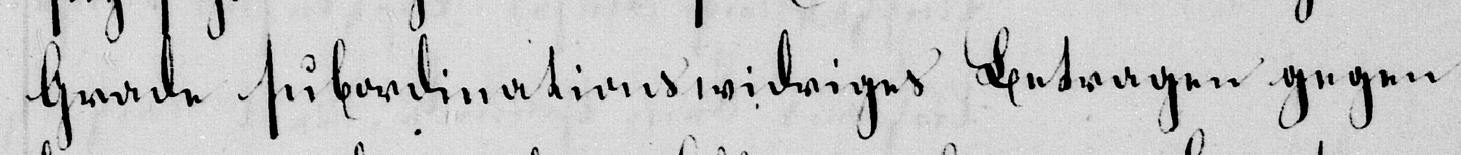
Grade subordinationswidriges Betragen gegen
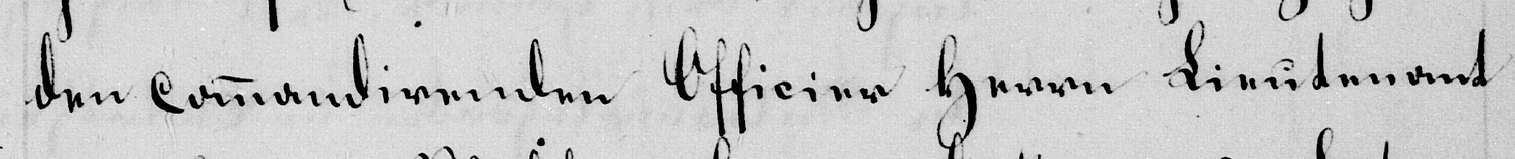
den commandirenden Officier Herrn Lieutenant
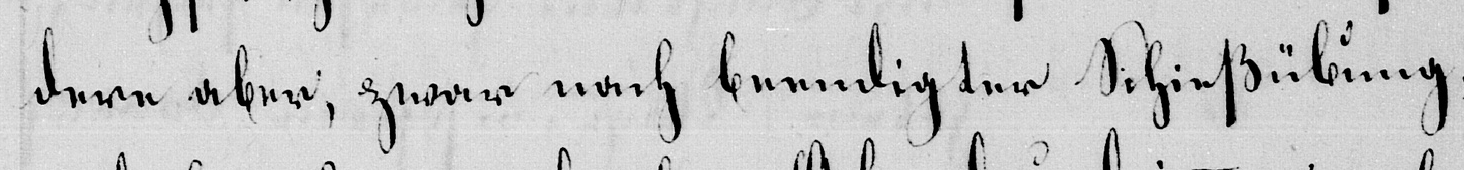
dere aber, zwar nach beendigter Schießübung,
